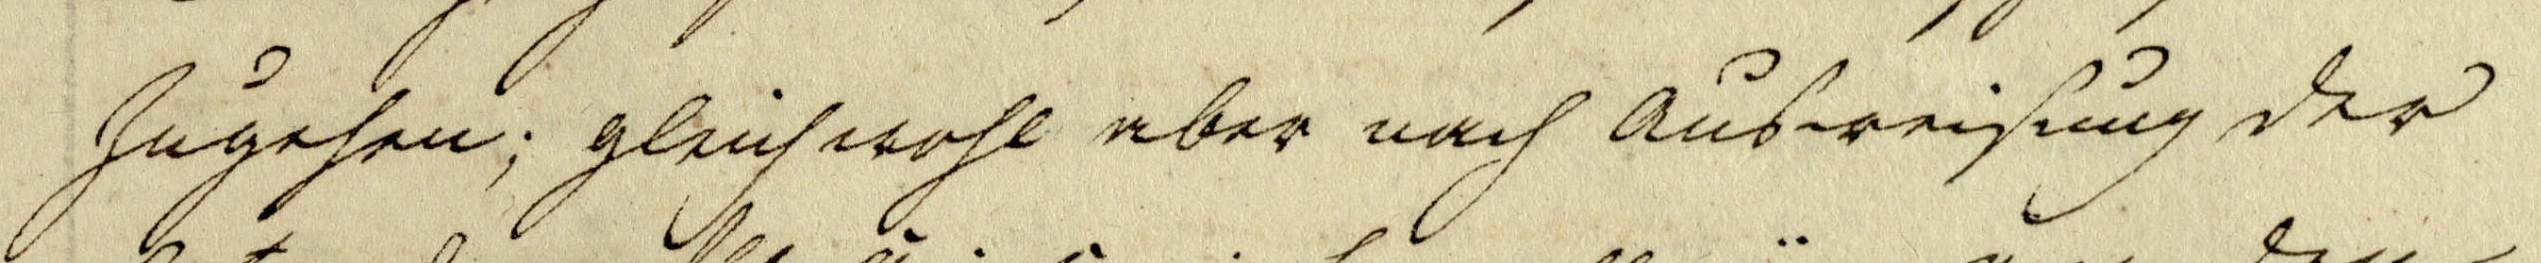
zugehen; gleichwohl aber nach Ausweisung der
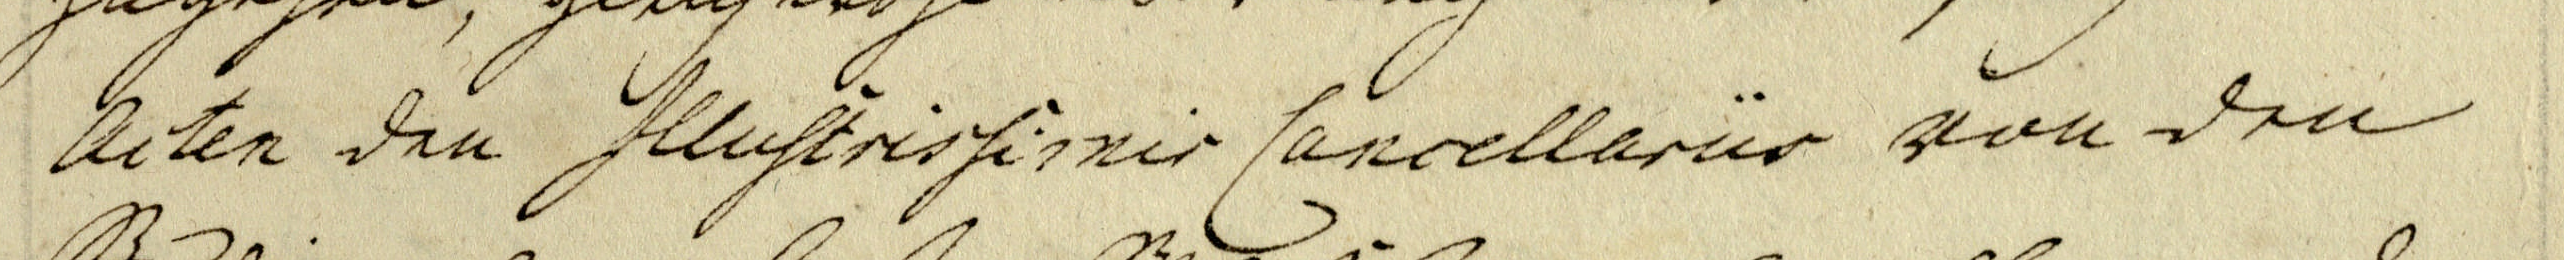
Acten den Ilustrissimis Cancellariis von den
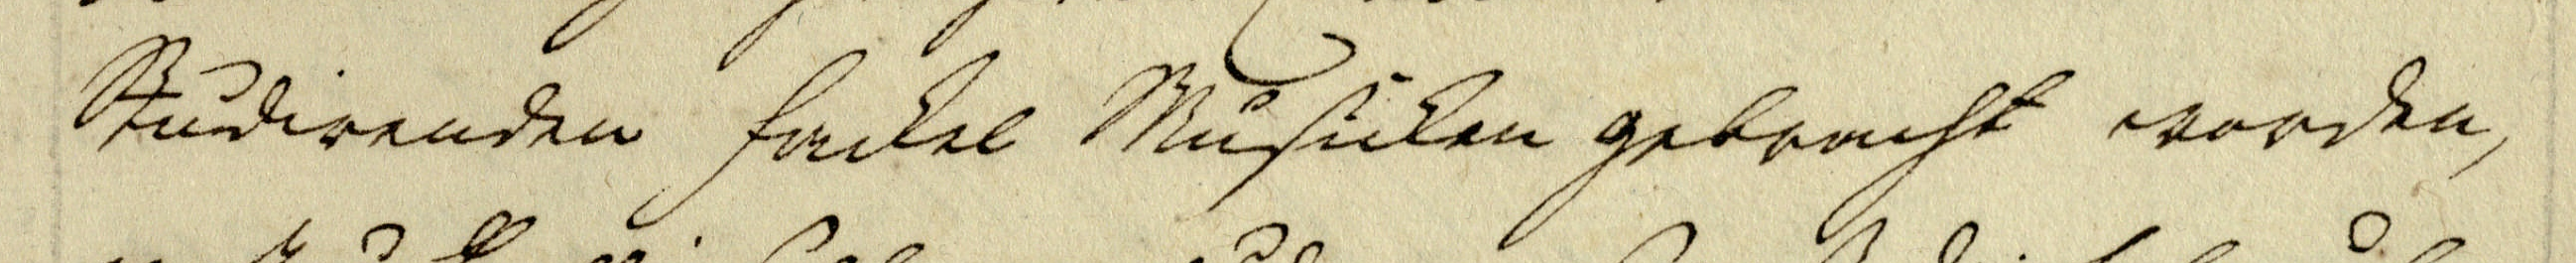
Studirenden Fackel Musicken gebracht worden,
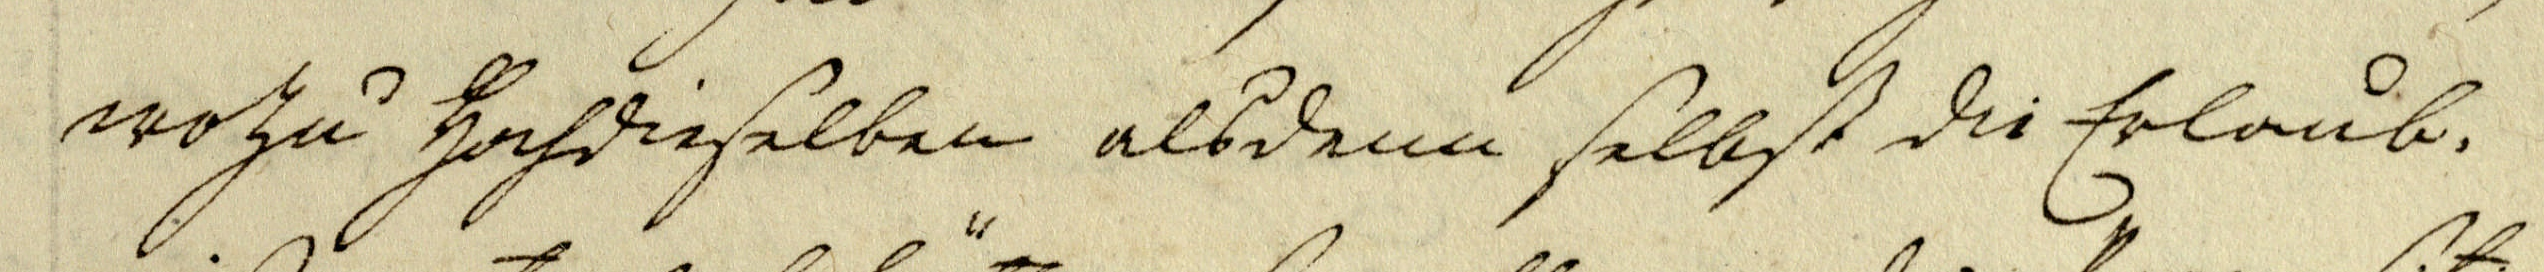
wozu Hochdieselben alsdenn selbst die Erlaub¬
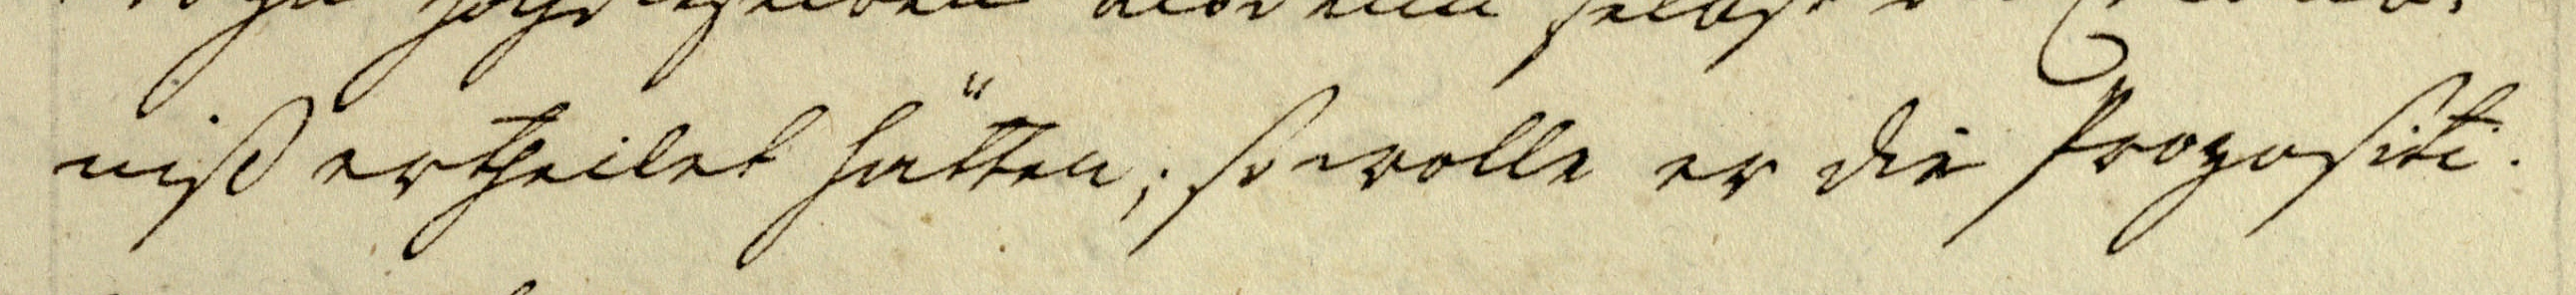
niß ertheilet hätten, so wolle er die Propositi¬
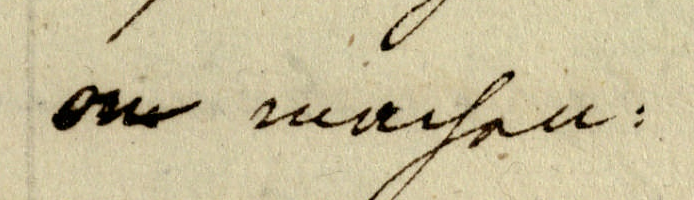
on machen:
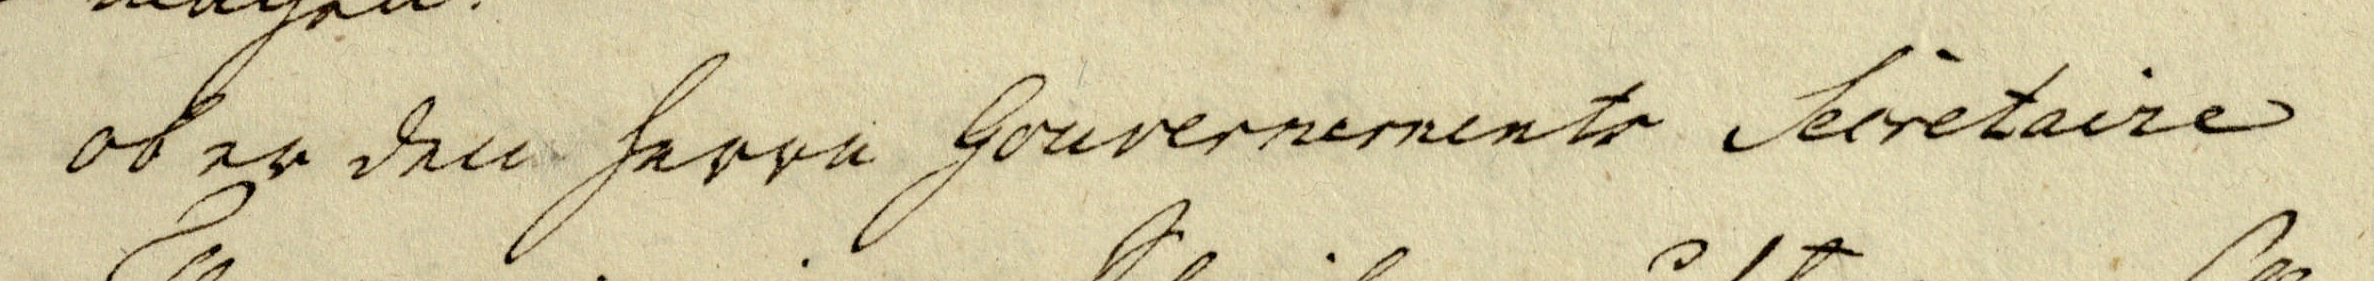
ob er den Herrn Gouvernements Secretaire
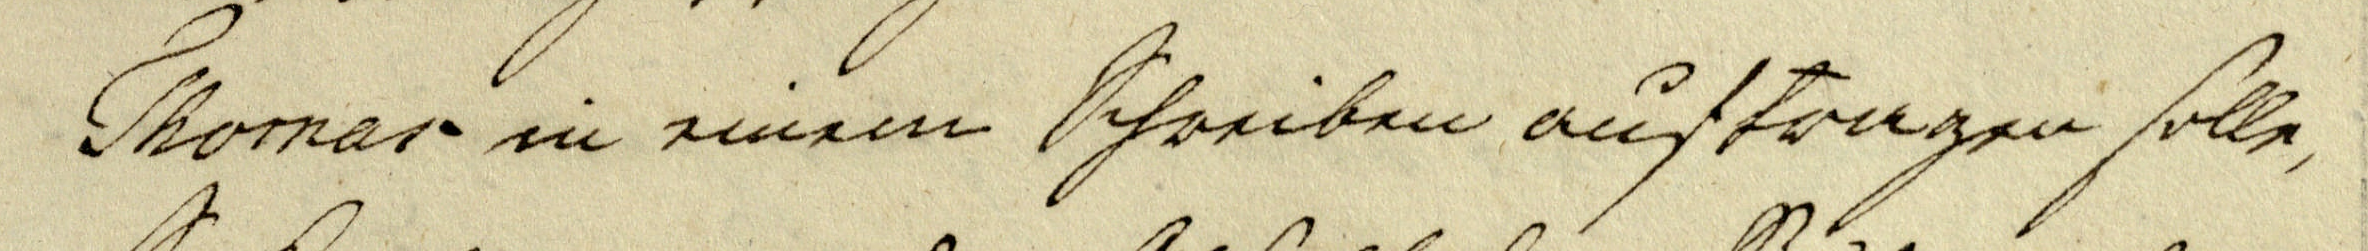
Thomas in einem Schreiben auftragen solle,
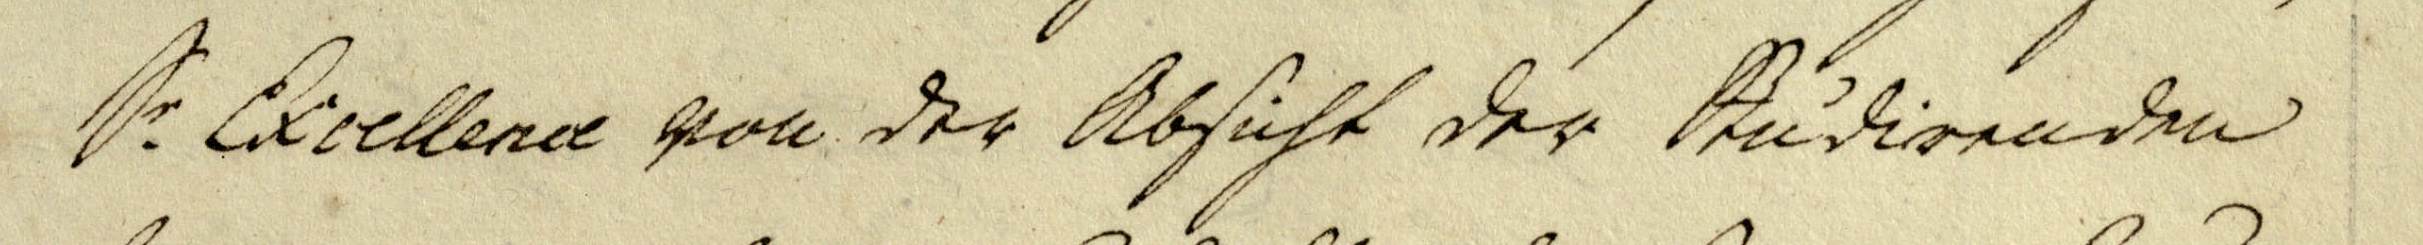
Sr Excellence von der Absicht der Studirenden
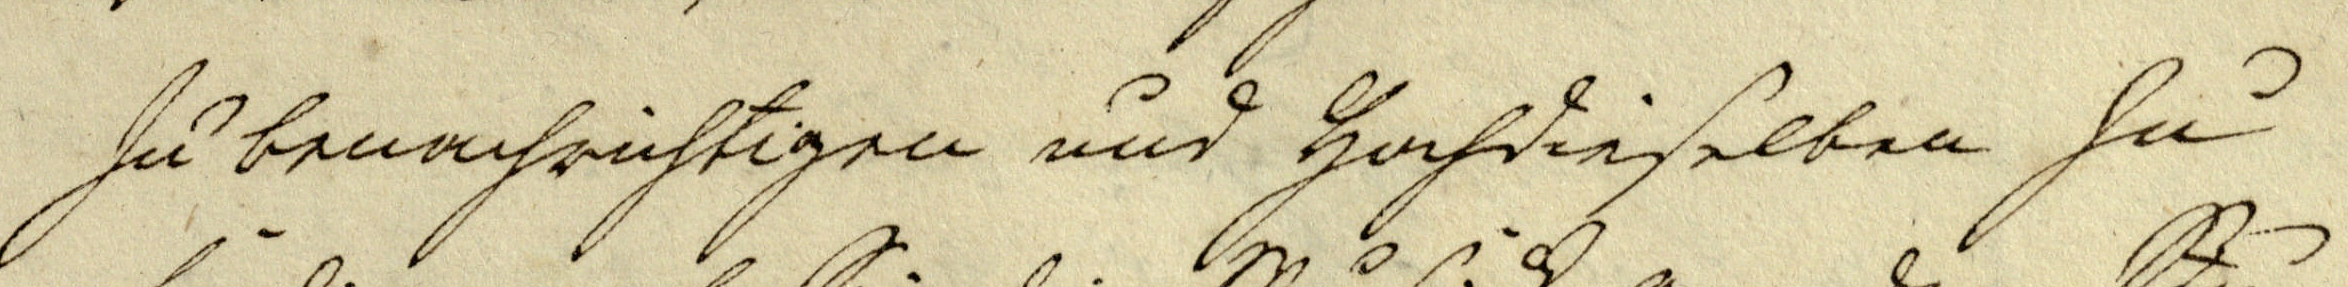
zu benachrichtigen und Hochdieselben zu
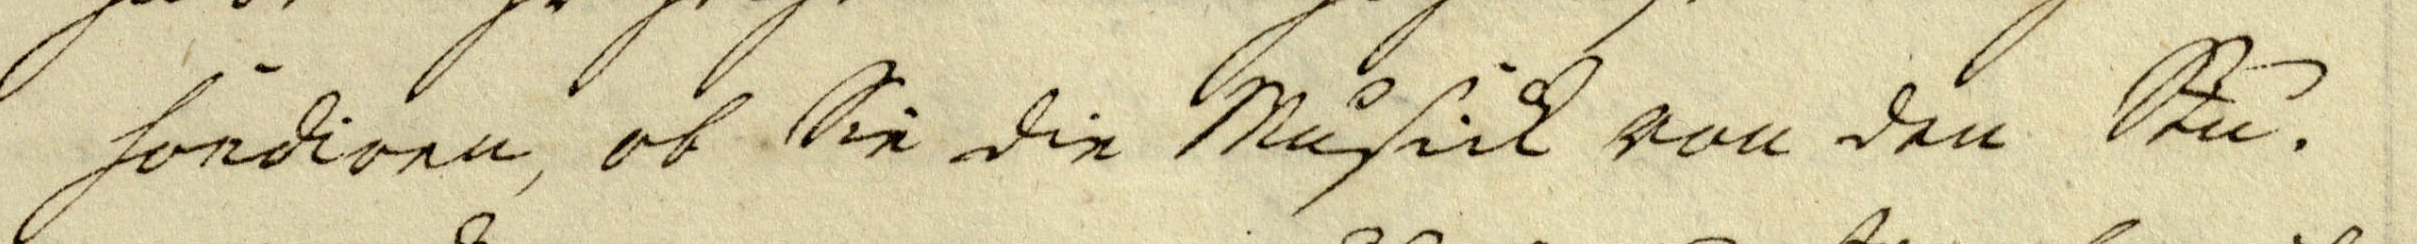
sondiren, ob Sie die Musick von den Stu¬
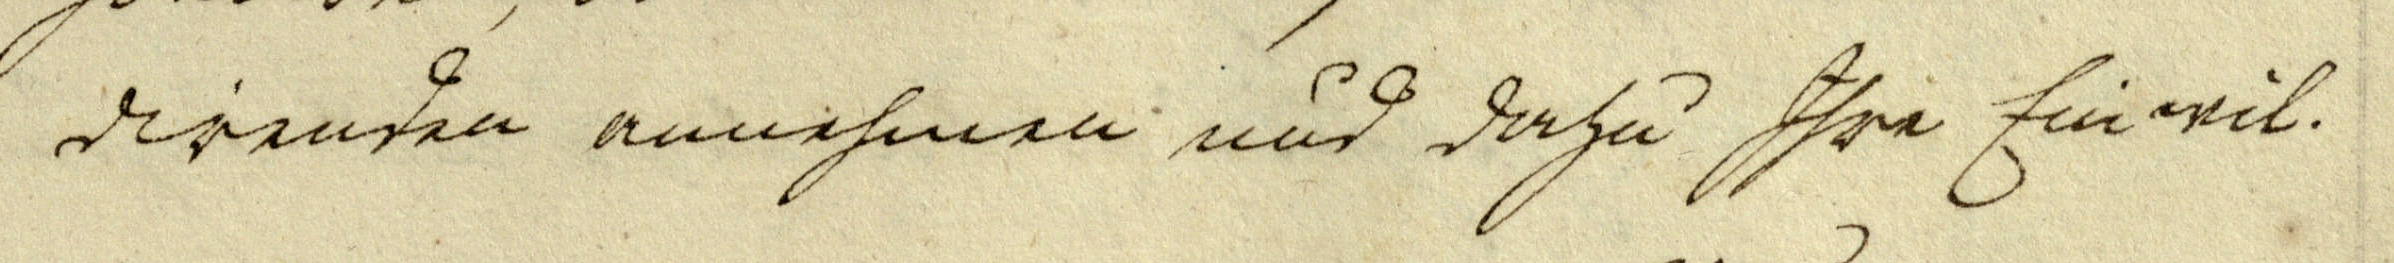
direnden annehmen und dazu Ihre Einwil¬
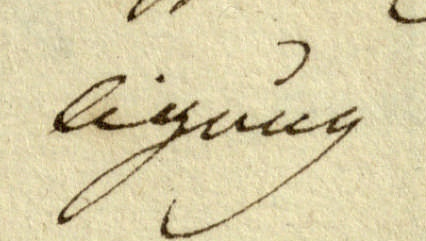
ligung
